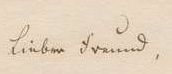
Lieber Freund,
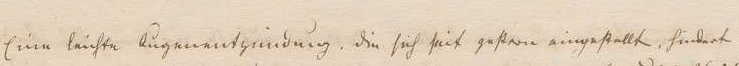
Eine leichte Augenentzündung, die sich seit gestern eingestellt, hindert
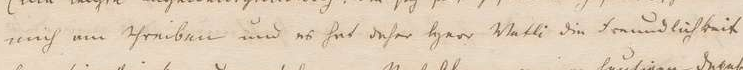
mich am Schreiben und es hat daher Wetli die Freundlichkeit
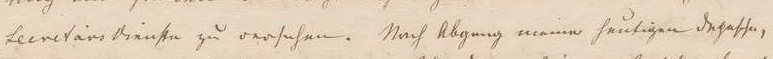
Secretärs Dienste zu versehen. Nach Abgang meiner heutigen Depesche,
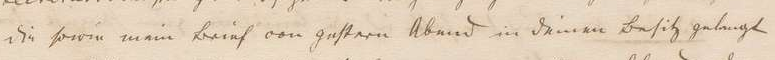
die sowie mein Brief von gestern Abend in Deinem Besitz gelangt
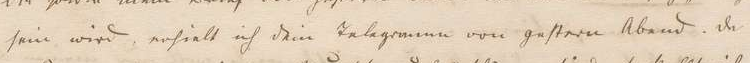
sein wird, erhielt ich Dein Telegramm von gestern Abend. Da
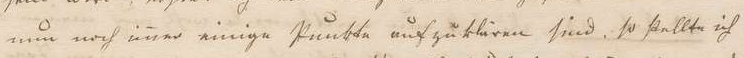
nun noch immer einige Punkte aufzuklären sind, so stellte ich
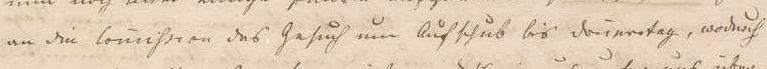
an die Commißion das Gesuch um Aufschub bis Donnerstag, wodurch
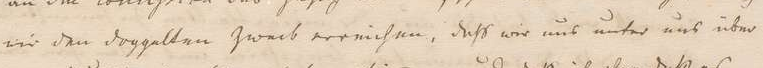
wir den doppelten Zweck erreichen, daß wir uns unter uns über
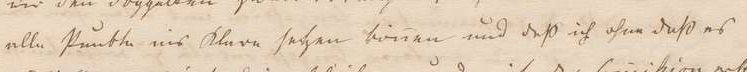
alle Punkte ins Klare setzen können und daß ich ohne daß es
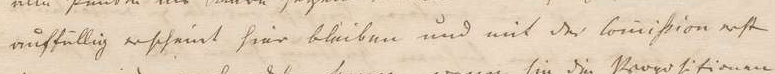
auffällig erscheint hier bleiben und mit der Commißion erst
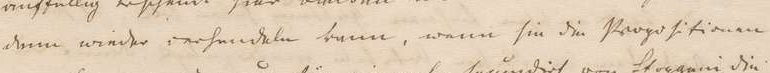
dann wieder verhandeln kann, wenn sie die Propositionen
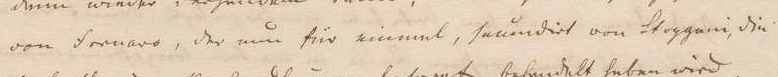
von Fornaro, der nun für einmal, secundirt von Stoppani, die
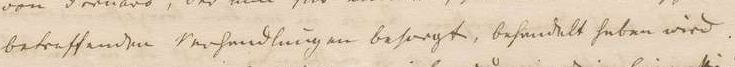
betreffenden Verhandlungen besorgt, behandelt haben wird.
